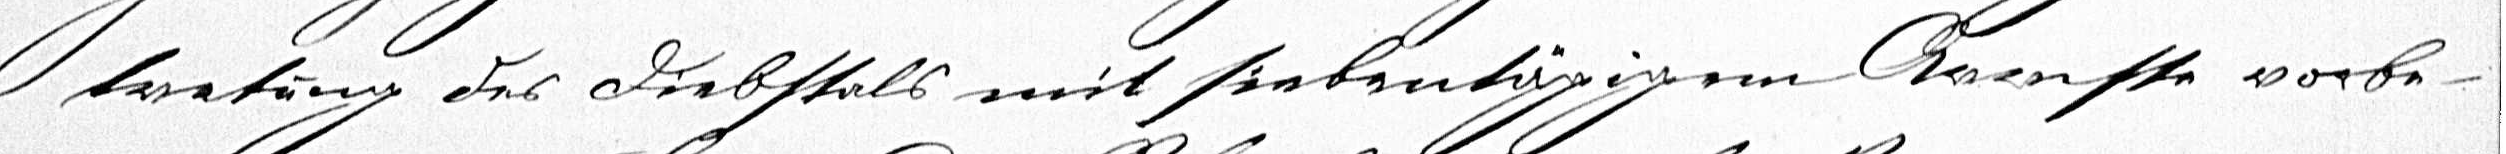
tretung des Diebstals mit siebentägigem xx vorbe¬
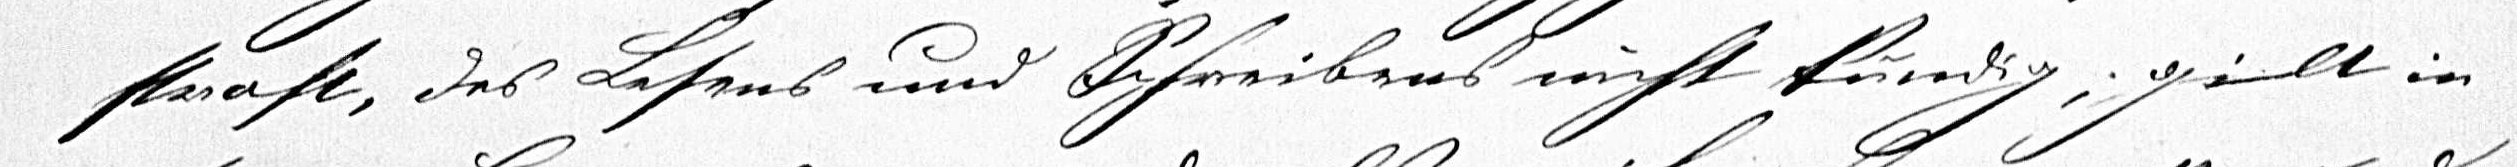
straft, des Lesens und Schreibens nicht kundig; gilt in
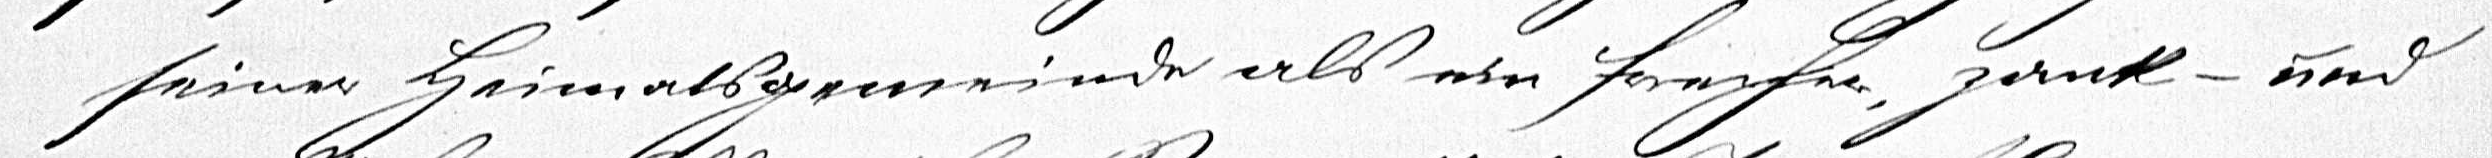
seiner Heimatsgemeinde als ein Frecher, zank- und
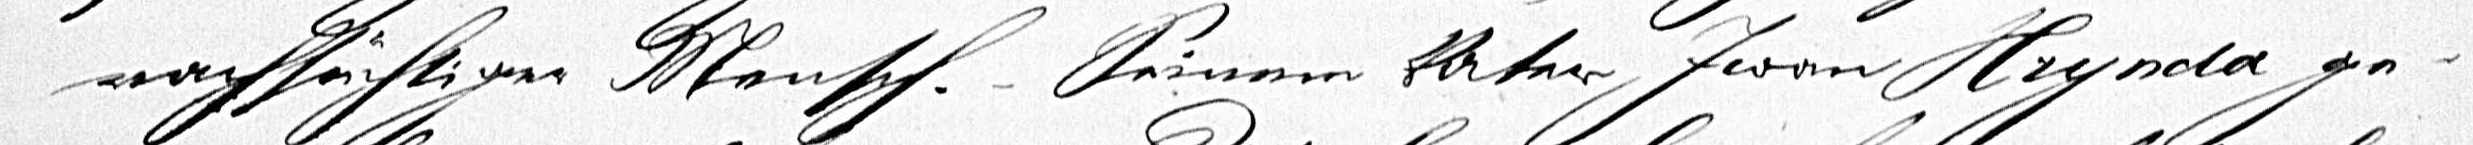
rachsüchtiger Mensch.- Seinem Vater Jwan Hrynda ge¬
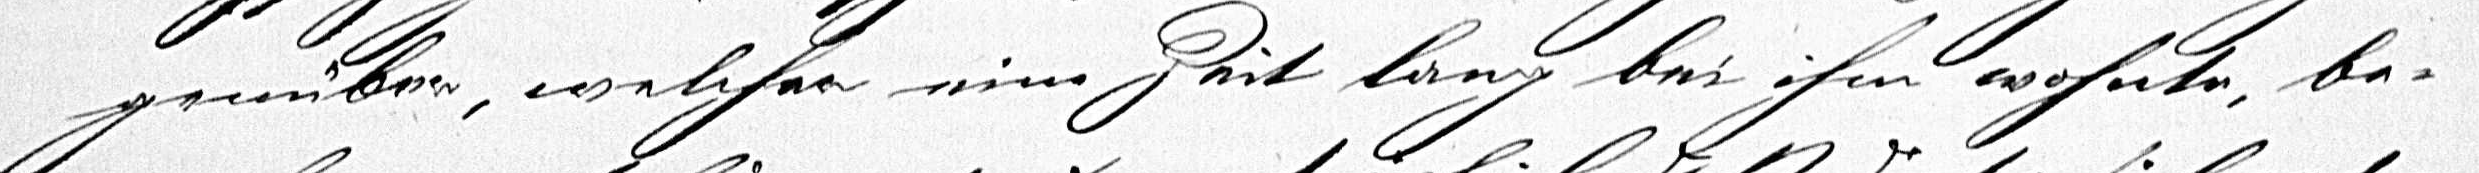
genüber, welcher eine Zeit lang bei ihm wohnte, be¬
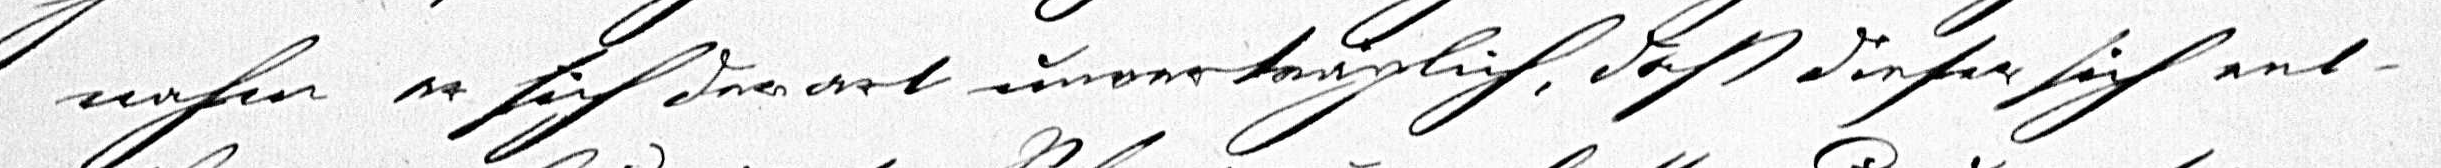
nahm er sich derart unerträglich, daß dieser sich ent¬
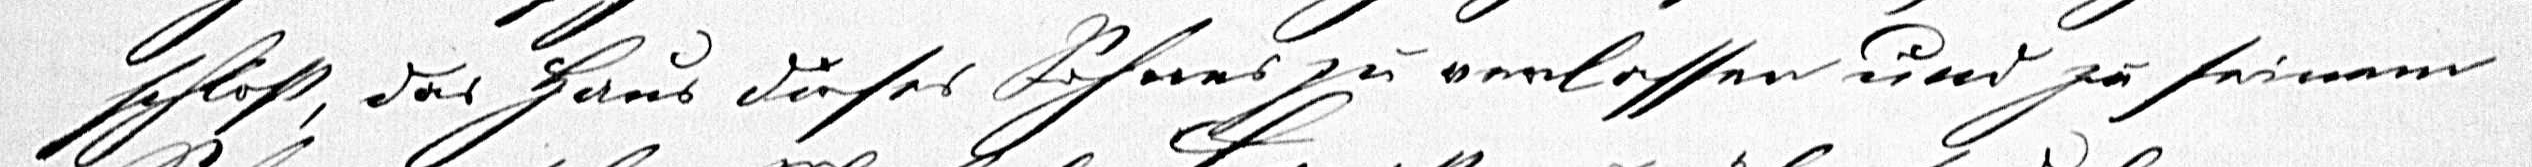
schloß, das Haus dieses Sohnes zu verlassen und zu seinem
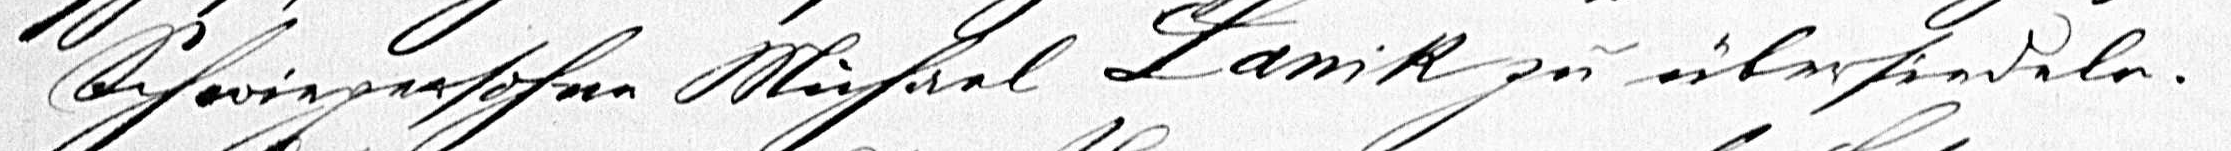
Schwiegersohne Michael Lanik zu übersiedeln.
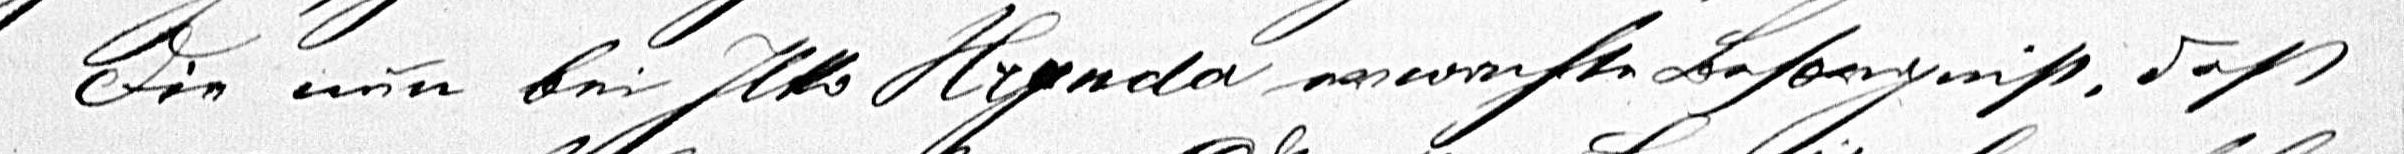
Die nun bei Jlko Hrynda erwachte Besorgniß, daß
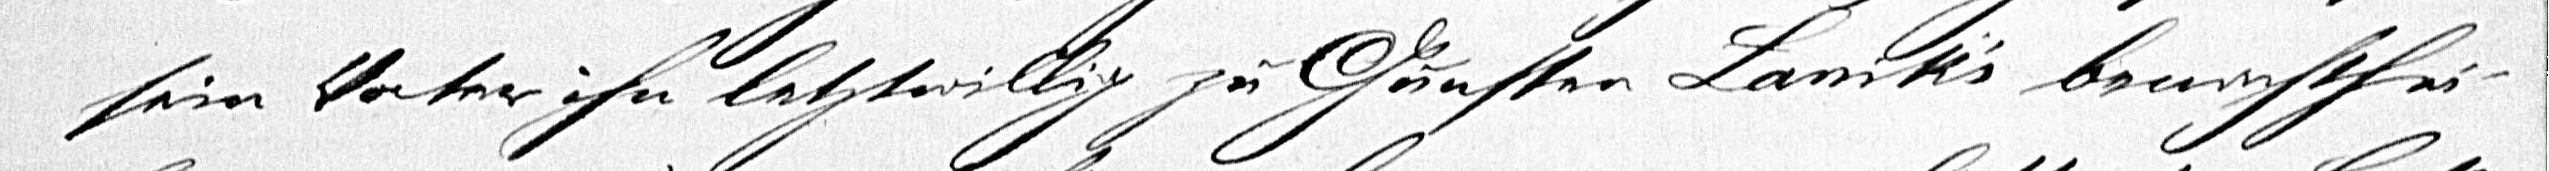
sein Vater ihn letztwillig zu Gunsten Lanik's benachthei¬
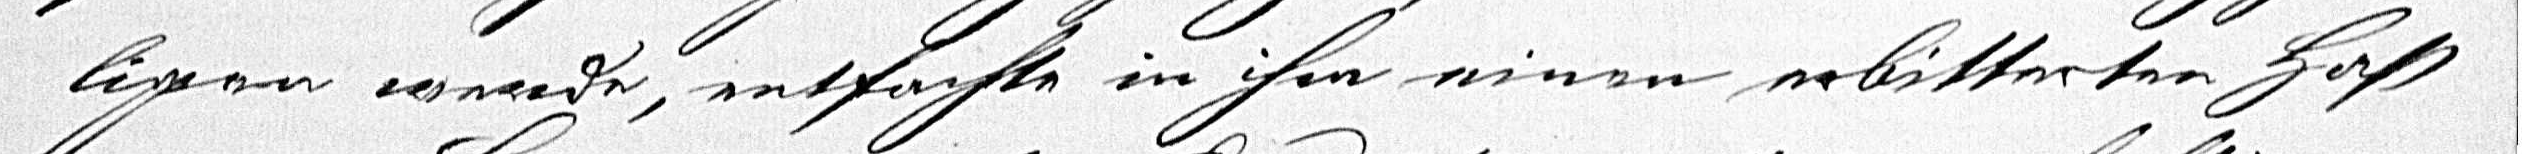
ligen werde, entfachte in ihm einen erbitterten Haß
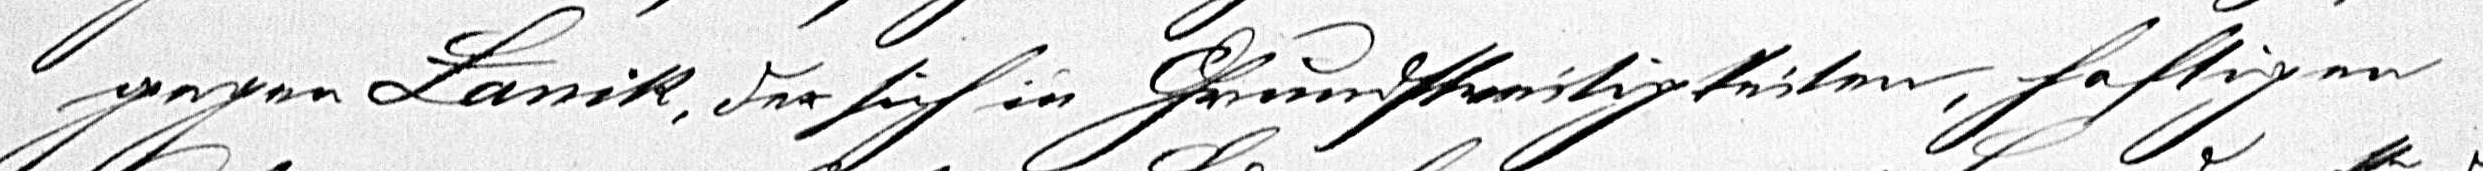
gegen Lanik, der sich in Grundstreitigkeiten, heftigen
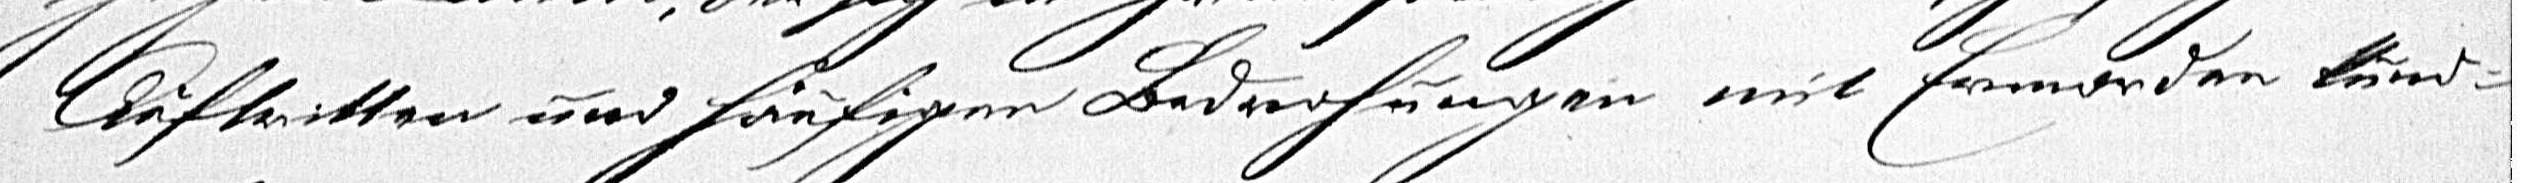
Auftritten und häufigen Bedrohungen mit Ermorden kund¬
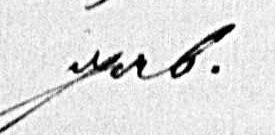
gab.
